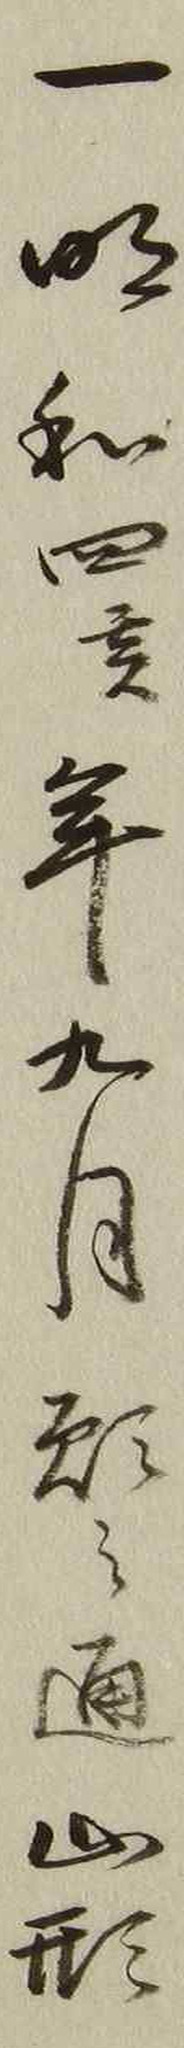一明和四亥年九月願之通山形
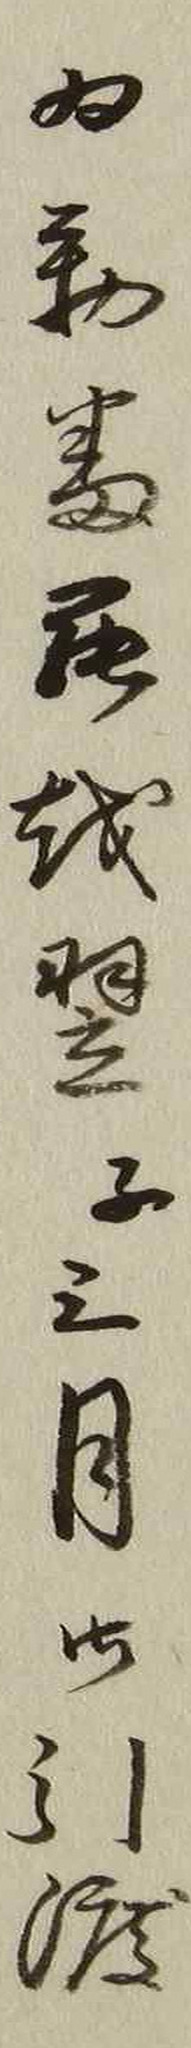為勤番罷越翌子三月御引渡
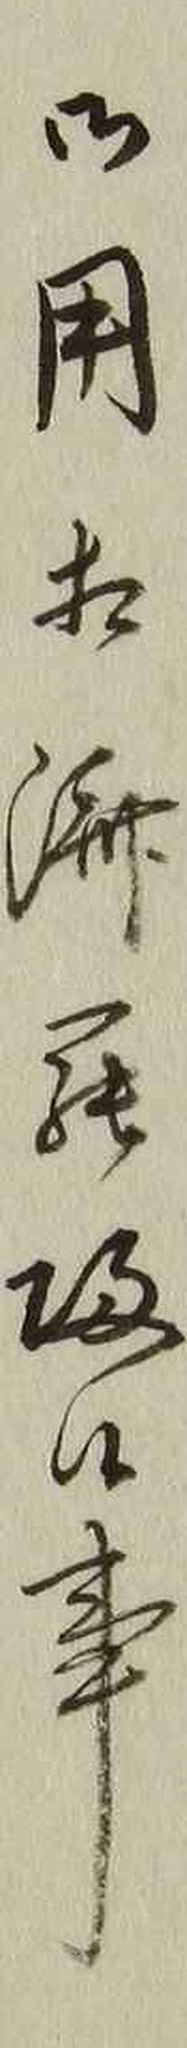御用相済罷帰候事
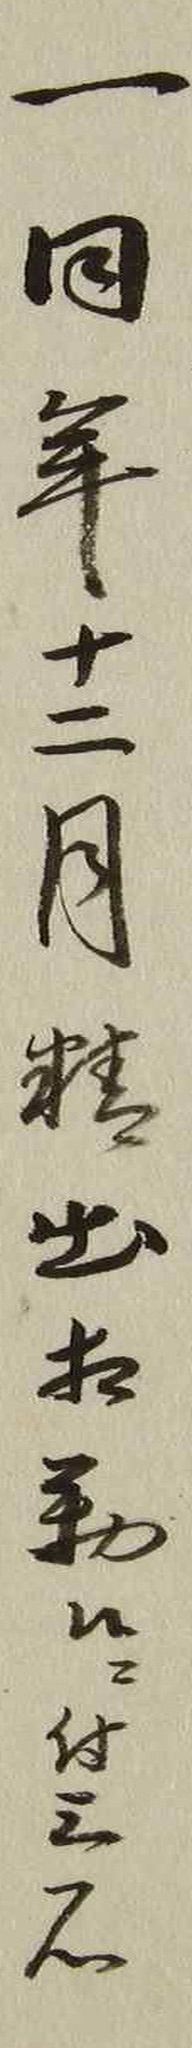一同年十二月精出相勤候ニ付三石
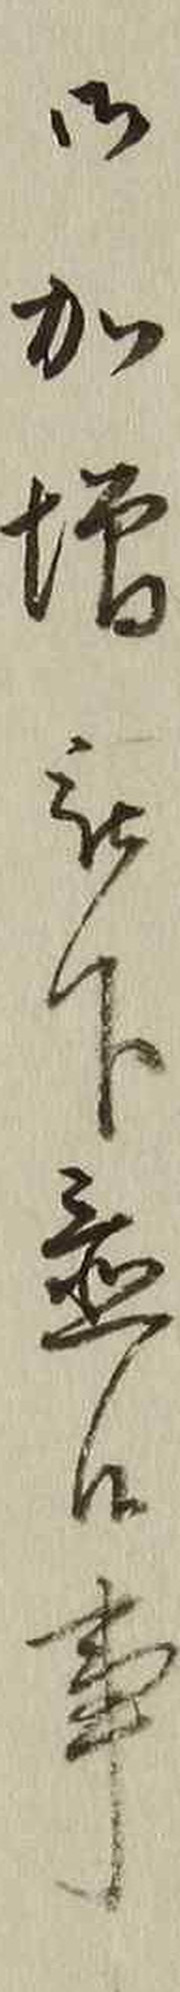御加増被下置候事
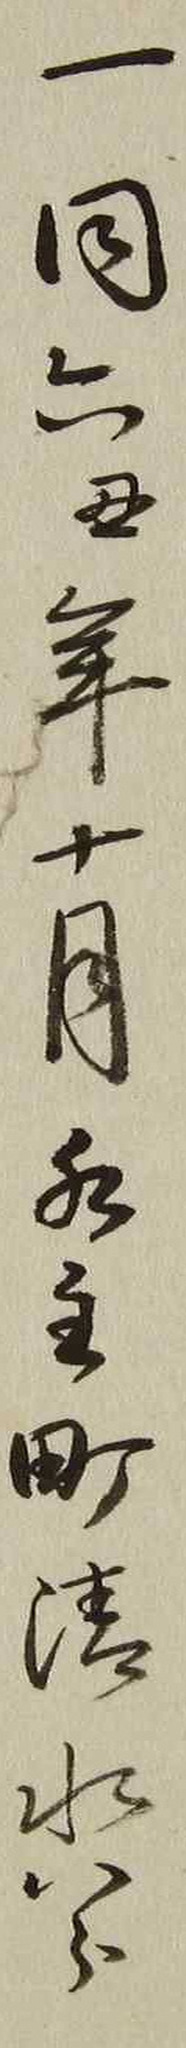一同六丑年十月水主町清水八郎
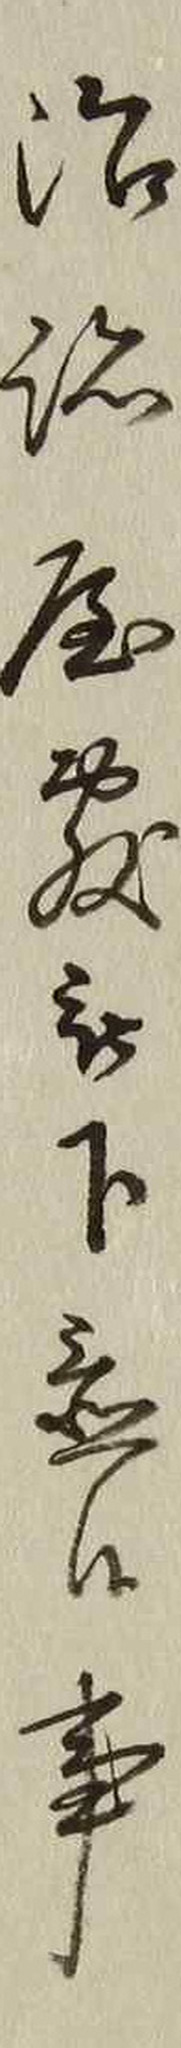治跡屋敷被下置候事
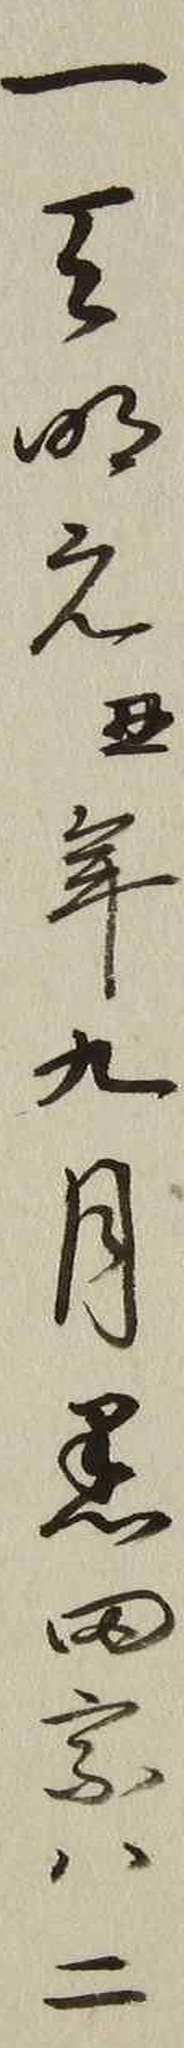一天明元丑年九月黒田宗八二
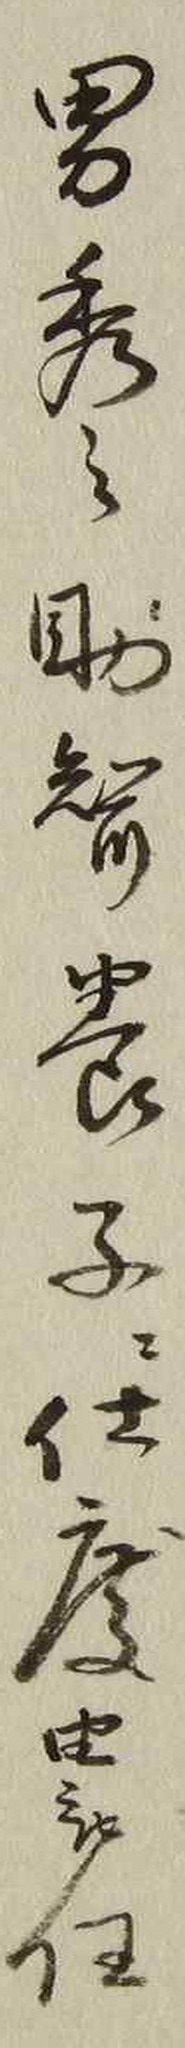男秀之助婿養子ニ仕度由被任
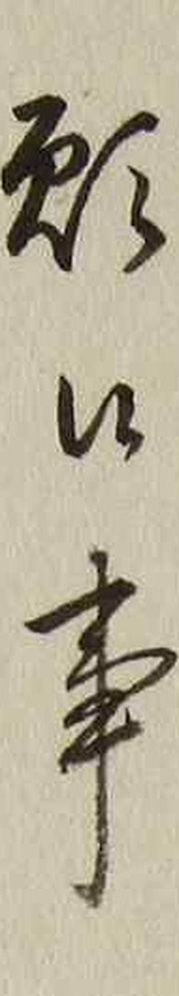願候事
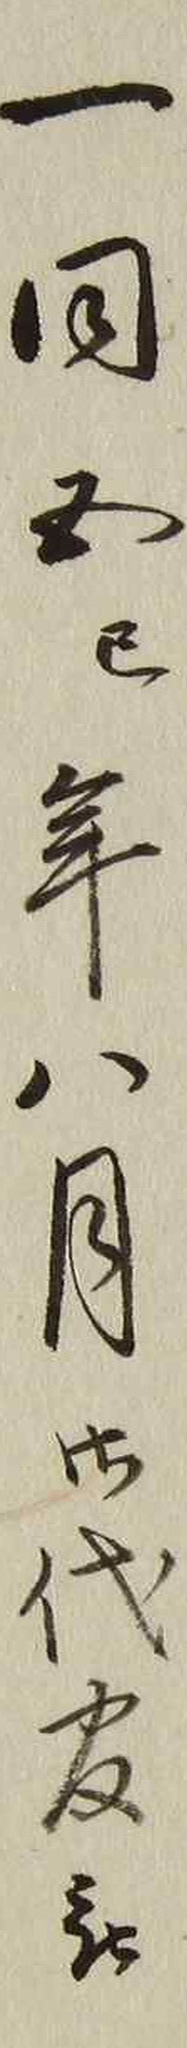一同五巳年八月御代官被
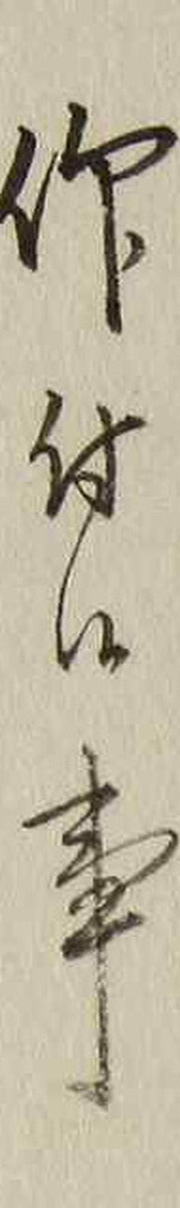仰付候事
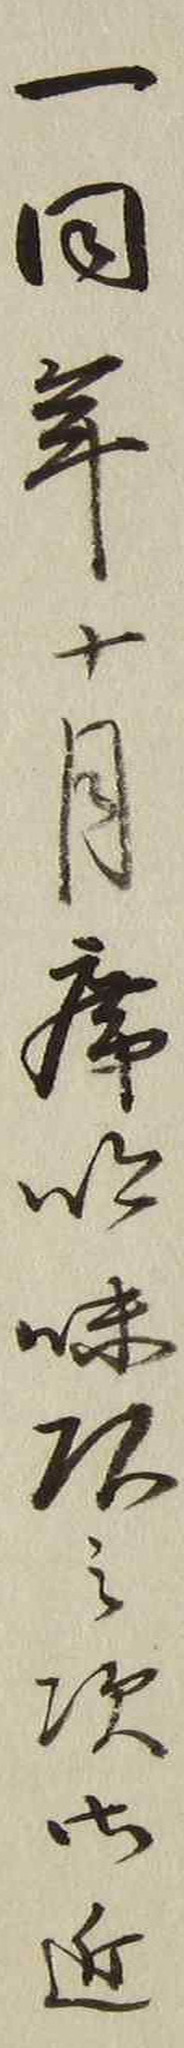一同年十月席吟味頭之次御近
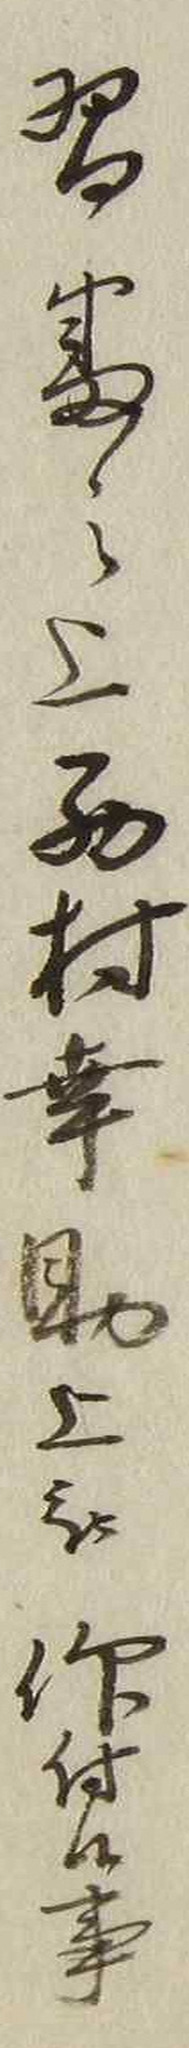習番之上西村幸助上被仰付候事
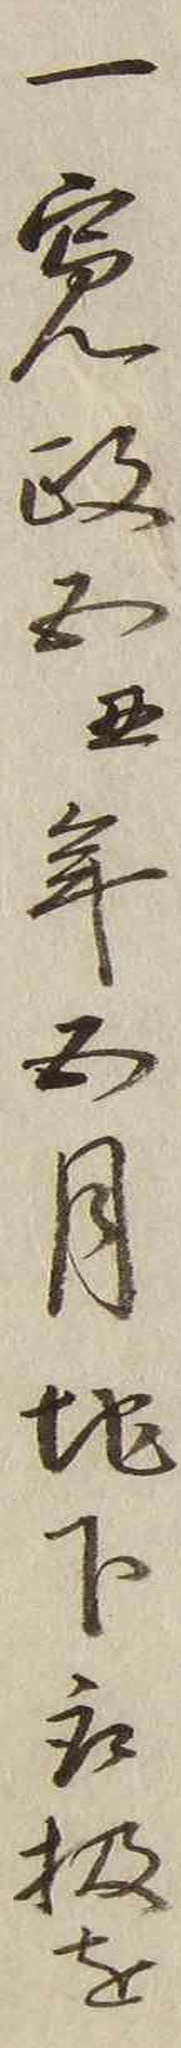一寛政五丑年五月地下取扱を

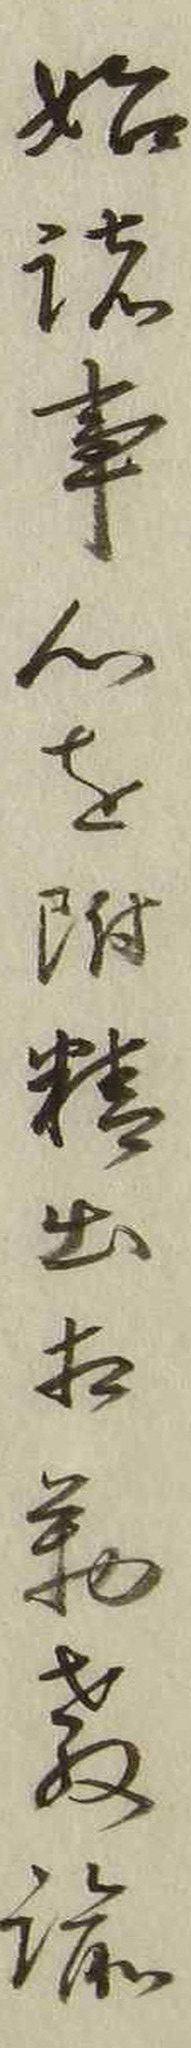始諸事心を附精出相勤教諭
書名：諸士系譜　巻之149　そ之部2
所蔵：会津若松市立会津図書館
